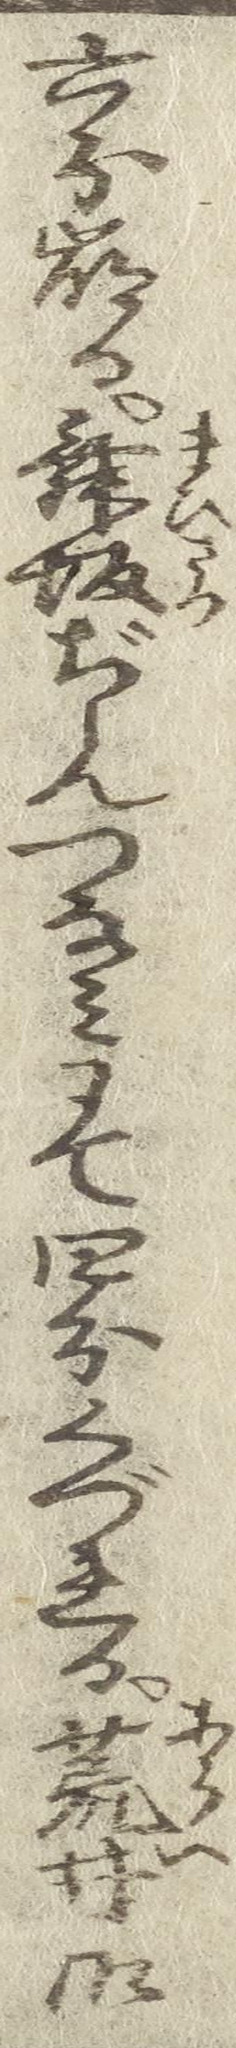六分崩る。舞坂ぢしんつなみにて四分くづれる。荒井御
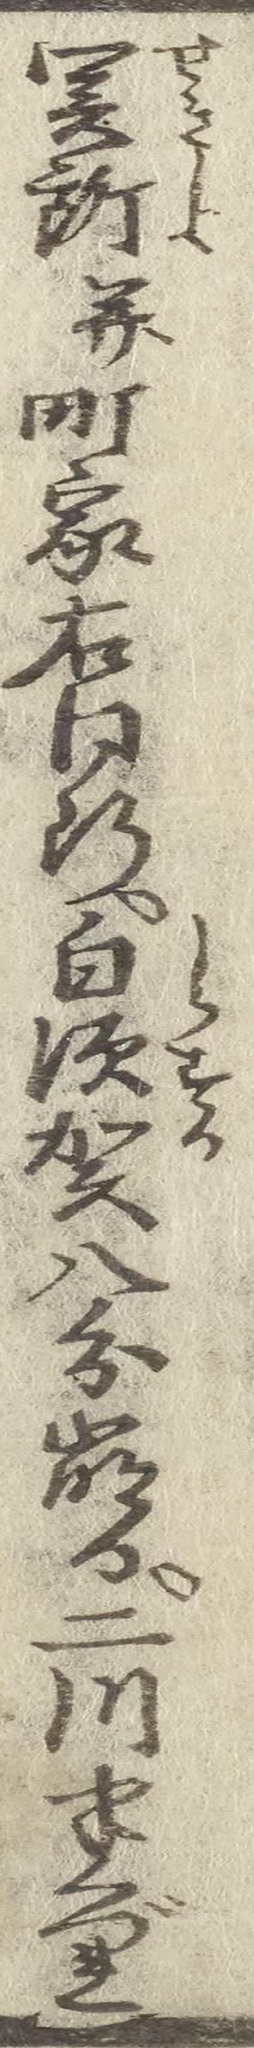関所并町家右同断。白須賀八分崩る。二川半くづれ
